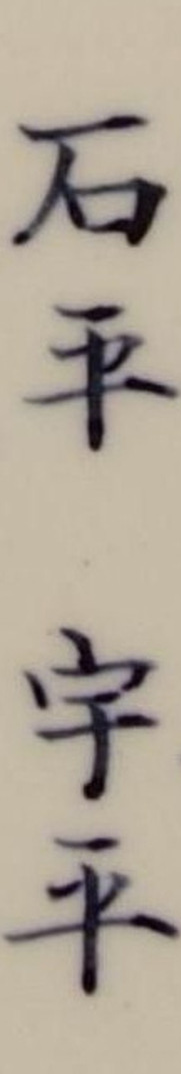石平宇平
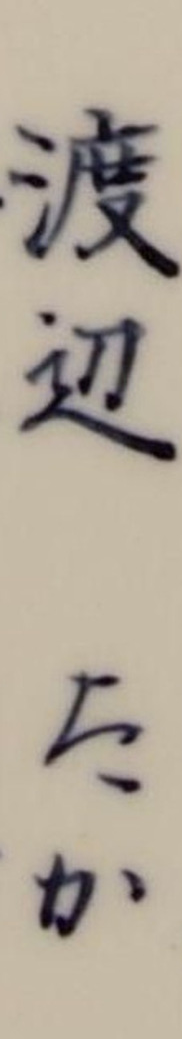渡辺たか
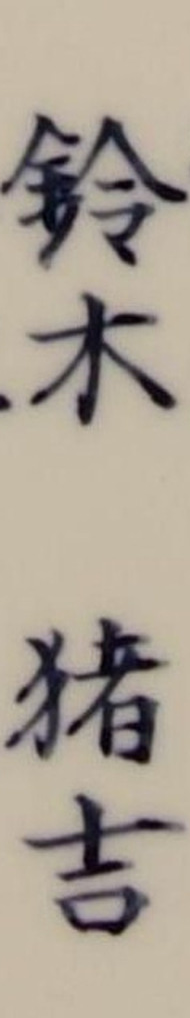鈴木猪吉
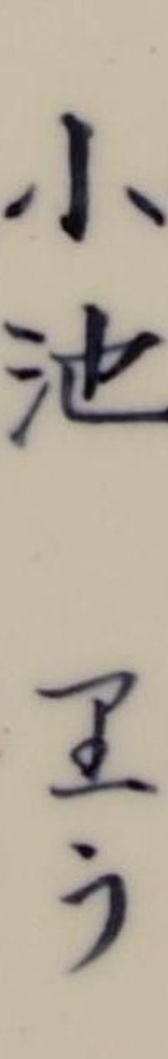小池りう
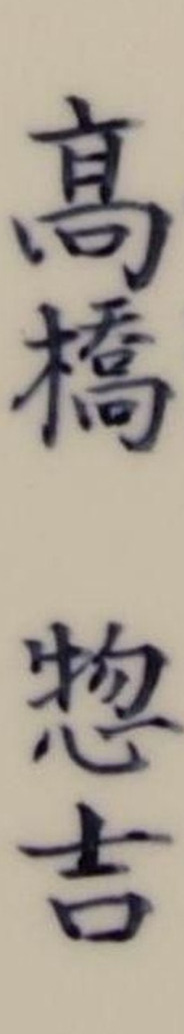高橋惣吉
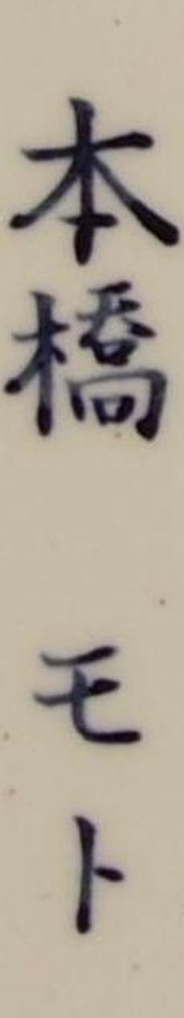本橋モト
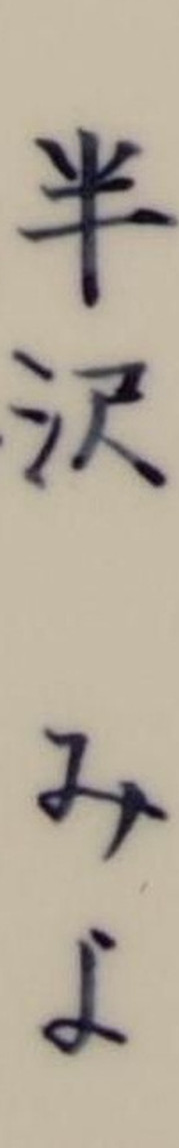半沢みよ
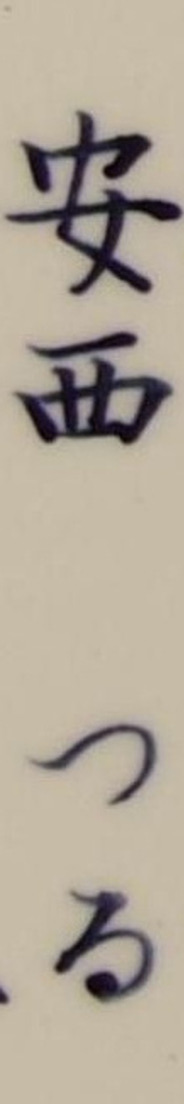安西つる
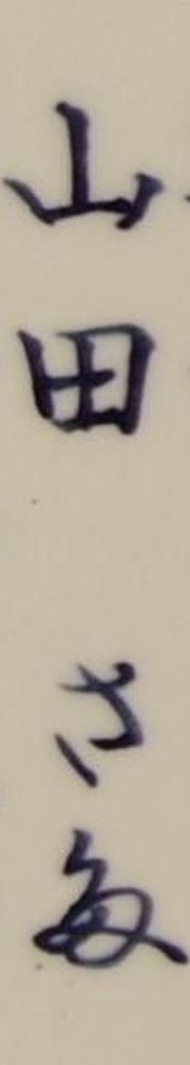山田さた
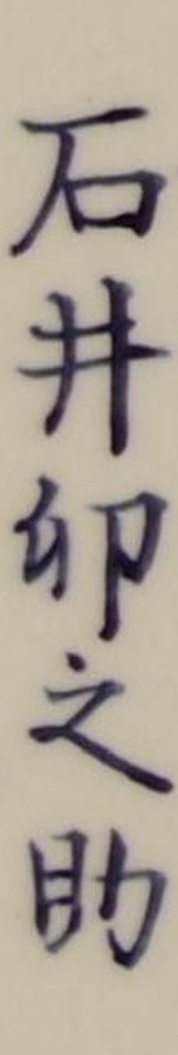石井卯之助
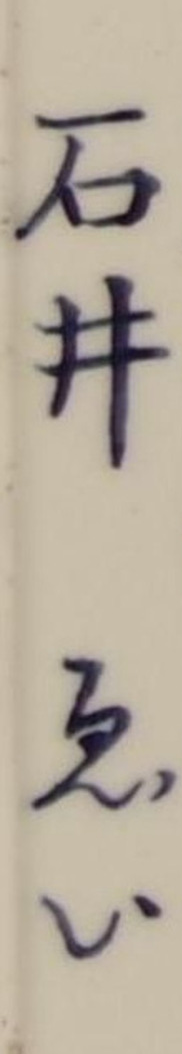石井ゑい

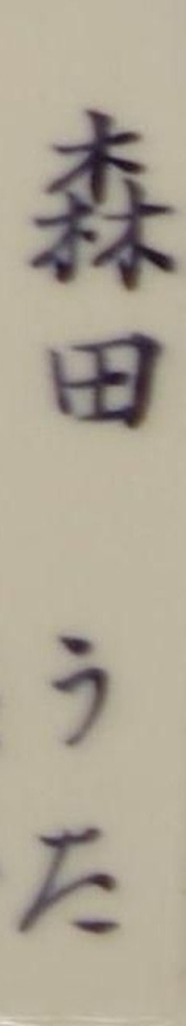森田うた
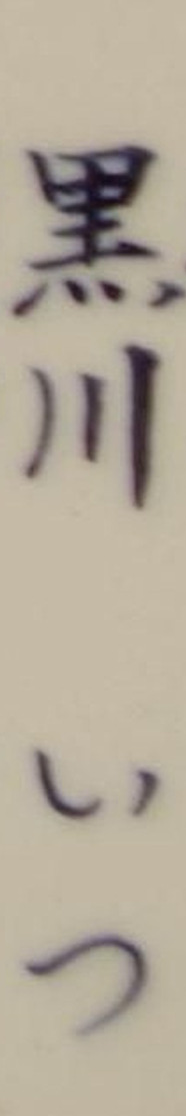黒川いつ
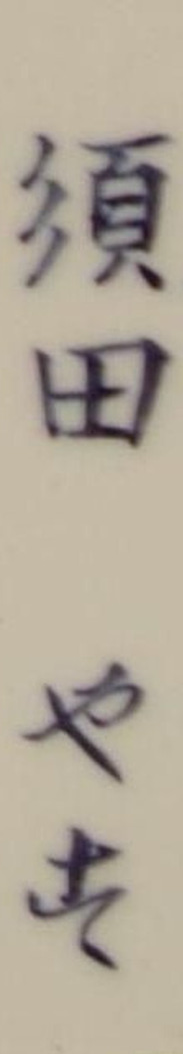須田やす
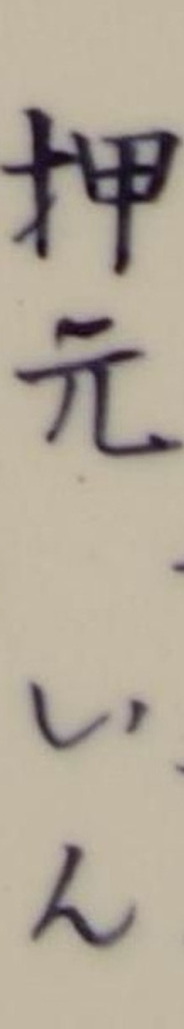押元いん
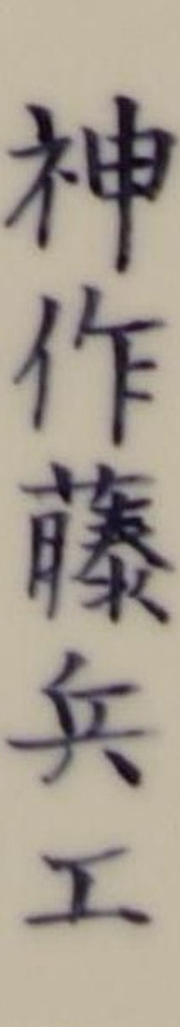神作藤兵衛
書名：M~S
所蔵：高野山金剛峯寺
